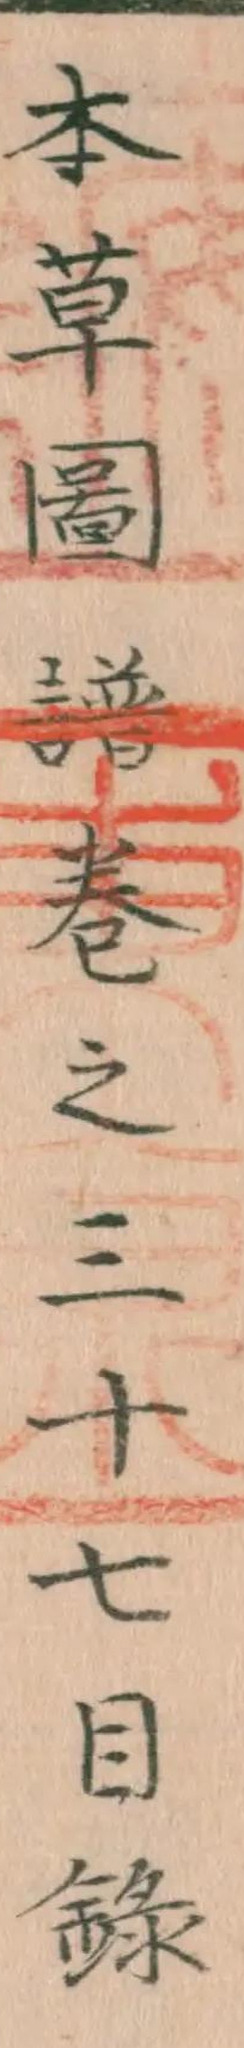本草図譜巻之三十七目録
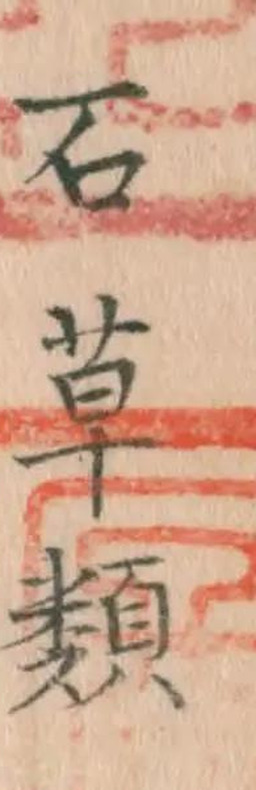石草類

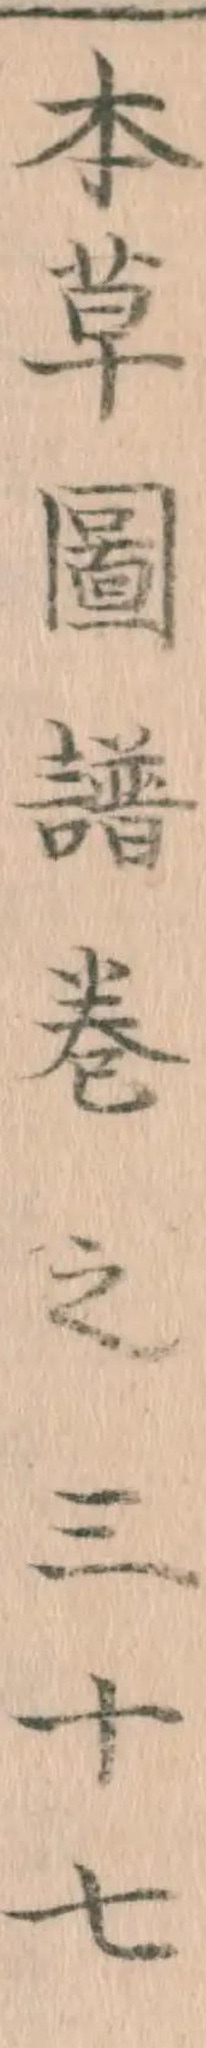本草図譜巻之三十七
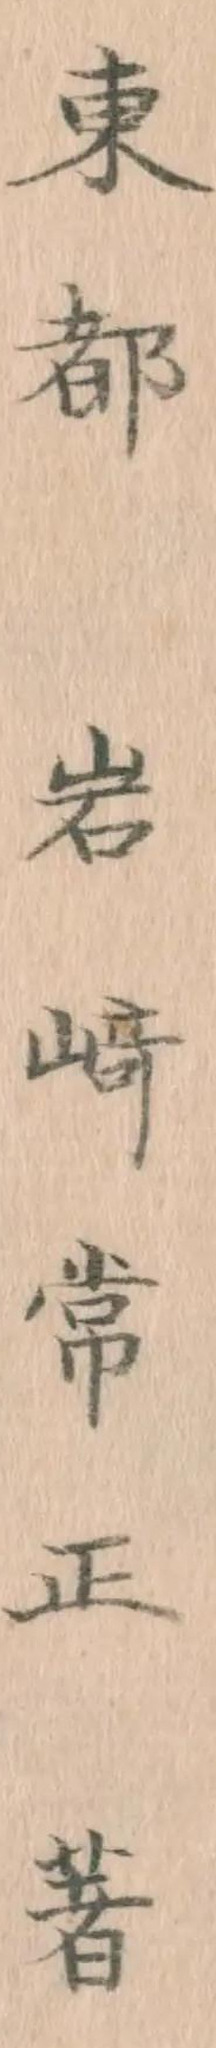東都岩崎常正著
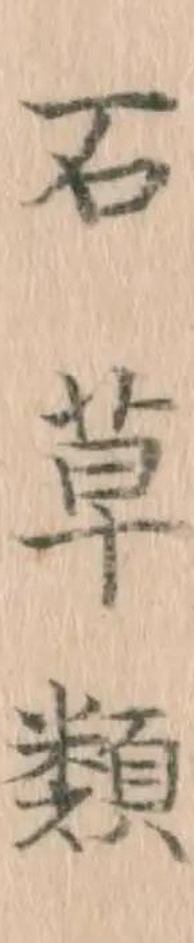石草類

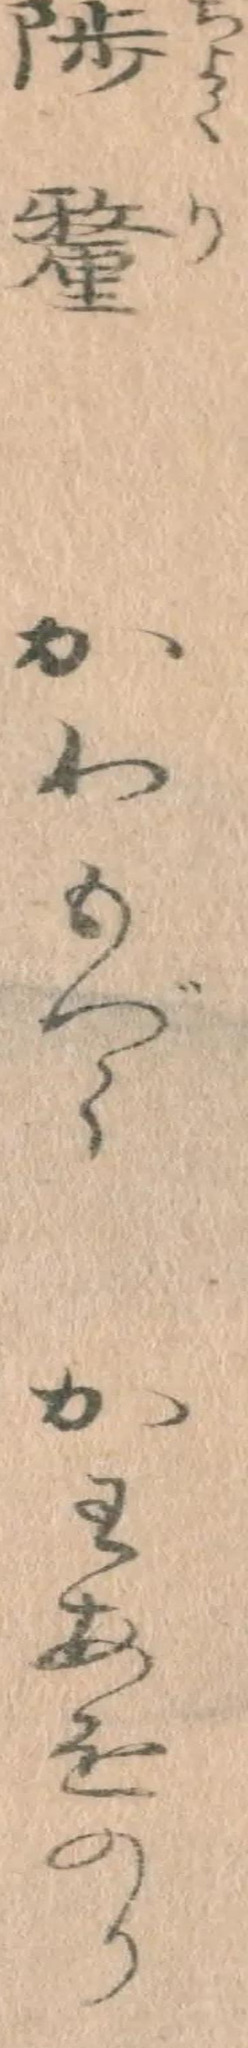陟釐かわもづくかわあをのり
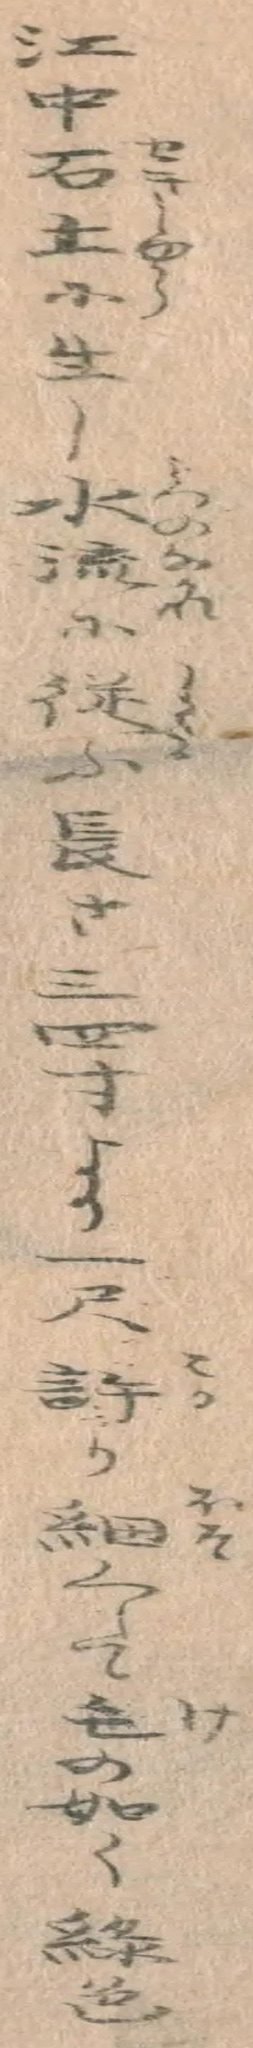江中石上に生し水流に従ふ長さ三四寸より一尺許り細くして毛の如く緑色
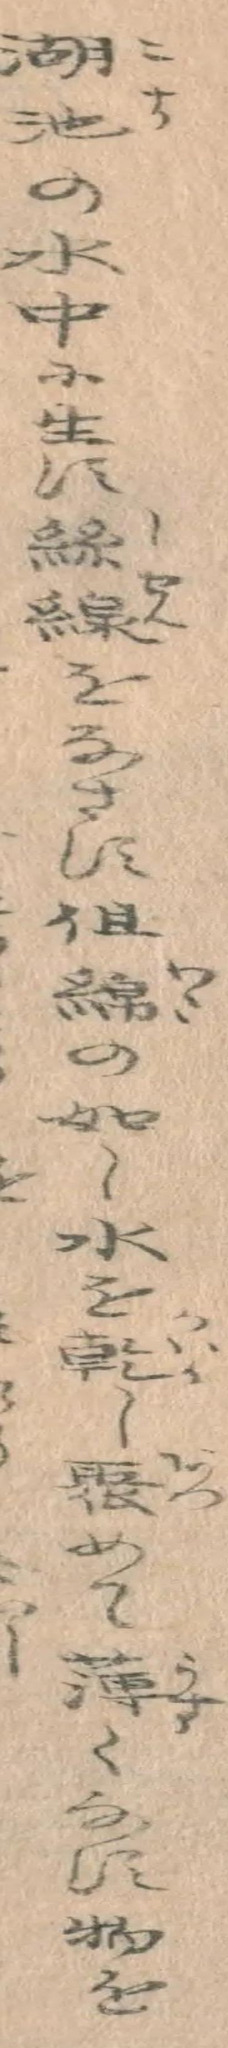湖池の水中に生す糸線をなさす但綿の如し水を乾し聚めて薄くなす物を
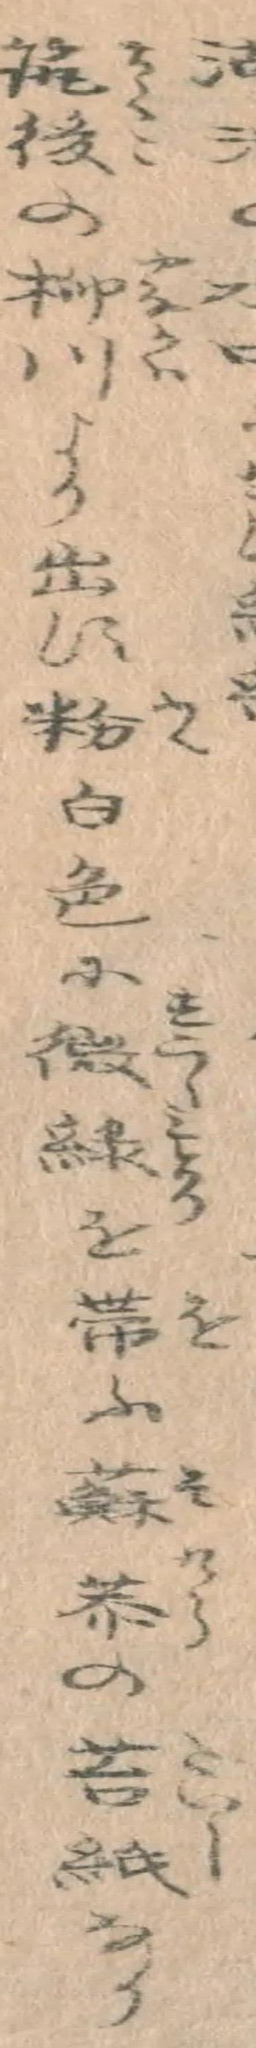筑後の柳川より出す粉白色に微緑を帯ふ蘇恭の苔紙なり

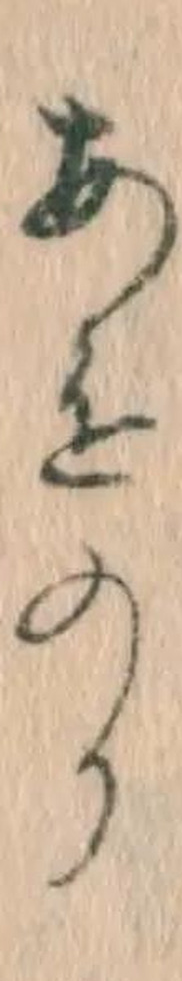あをのり
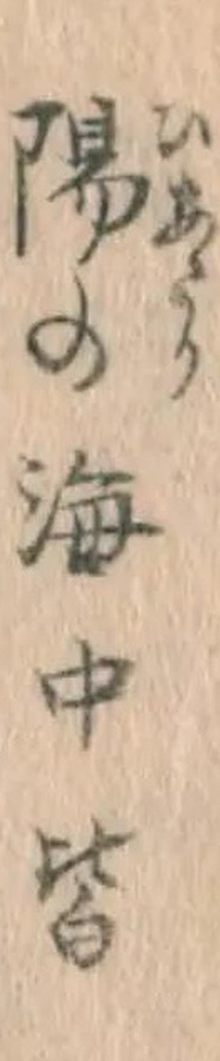陽の海中皆
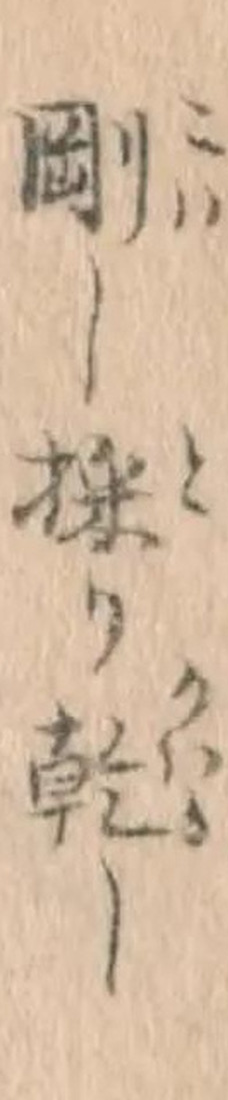剛し採り乾し
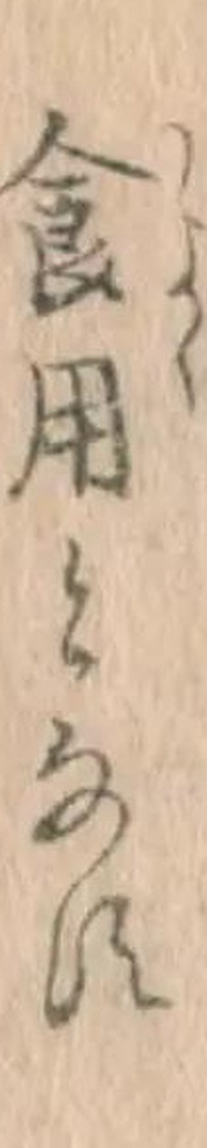食用となす

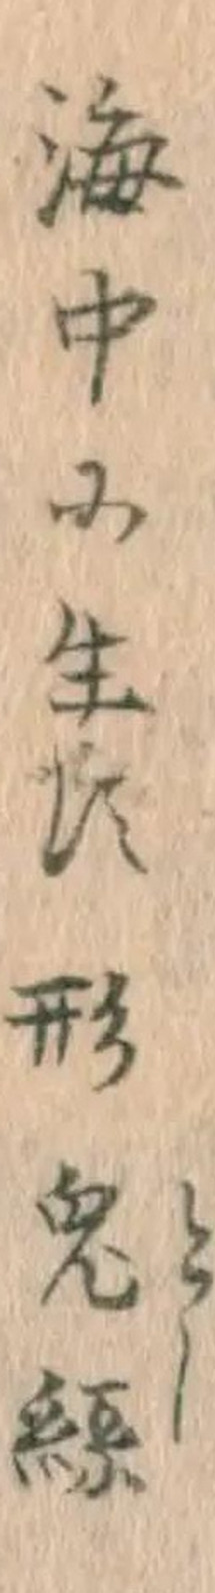海中に生す形兎糸
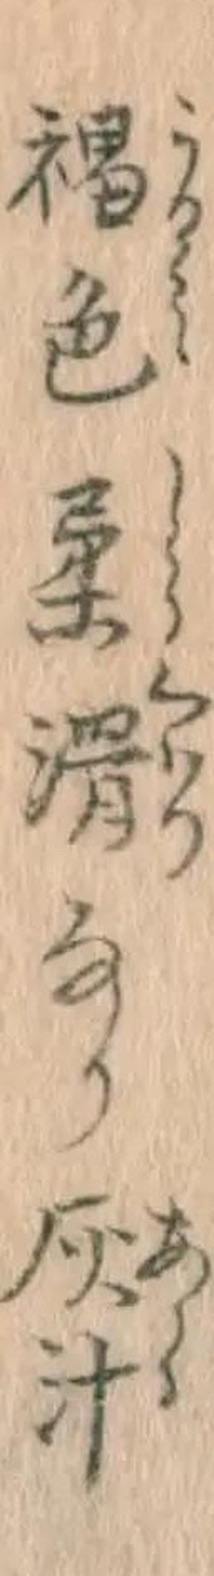褐色柔滑なり灰汁
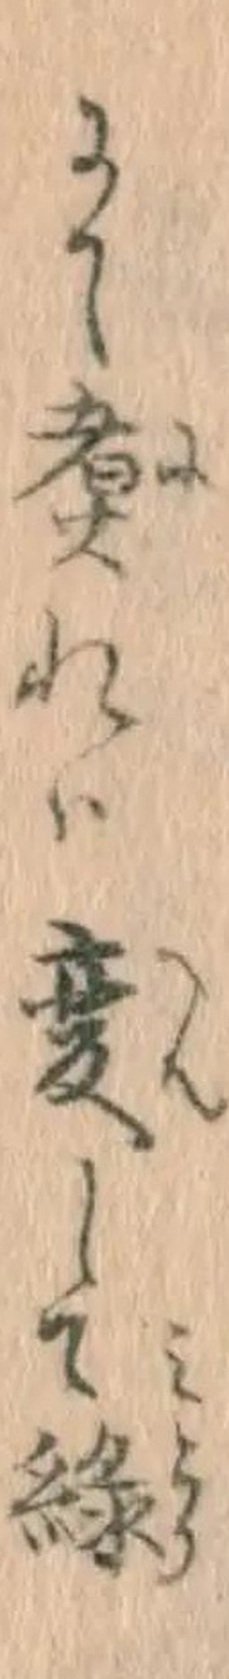にて煮れは変して緑
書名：本草図譜. 巻37-39
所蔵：国立国会図書館 National Diet Library, JAPAN
